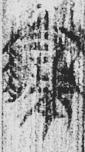寢
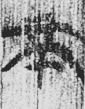不
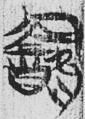飲酒
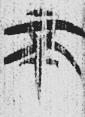不
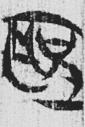聖（聽）
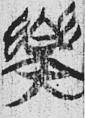樂
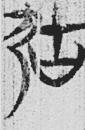居
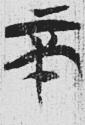不
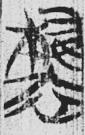○（設）
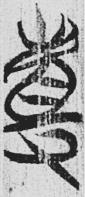○（席）
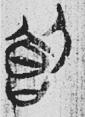{食人}（食）
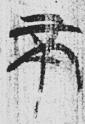不
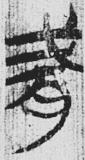{弍肉}（二）
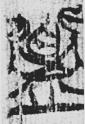{弜鬲釆}（羹）
